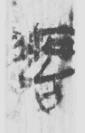差
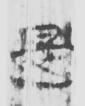是
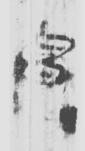胃
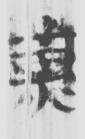黃
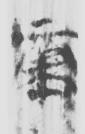帝
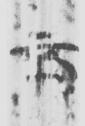不
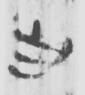出
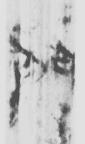門
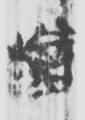{木八言}
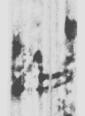㠯（以）
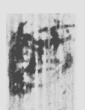智
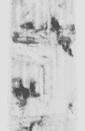四
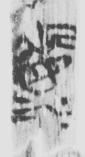海
